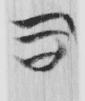司
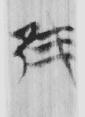隹
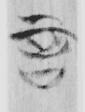言
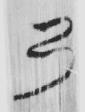乃
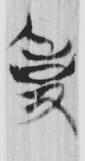事
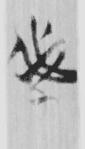我
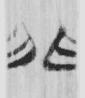非
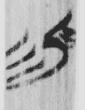易
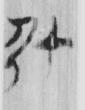引
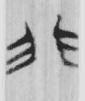行
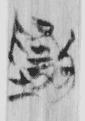{阜圭㕛力}
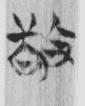敬
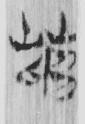茅
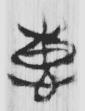惠
